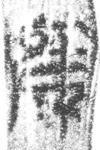○（集）
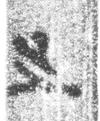之
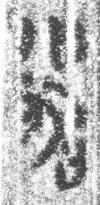器
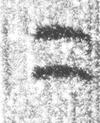二
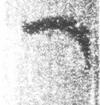一
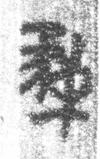聅
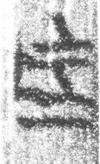{土圭}
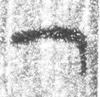一
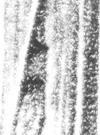二
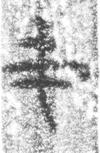屯
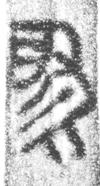緅
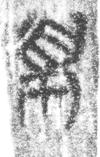{首巾}
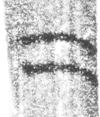二
